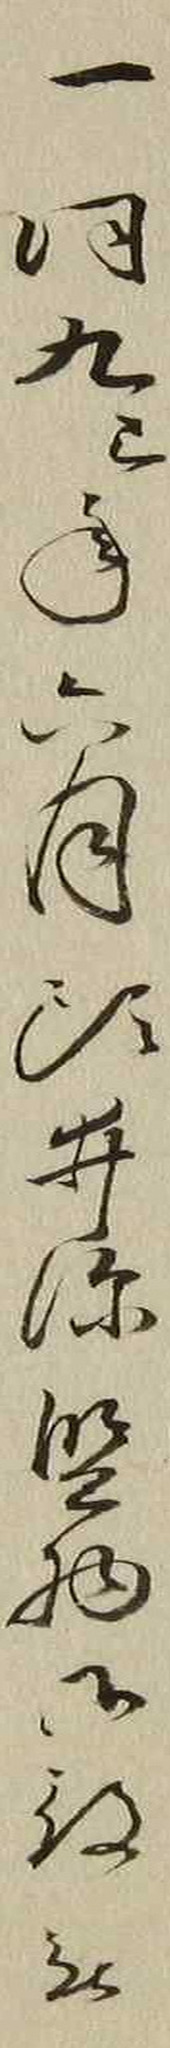一同九巳年六月頭井深監物御役被
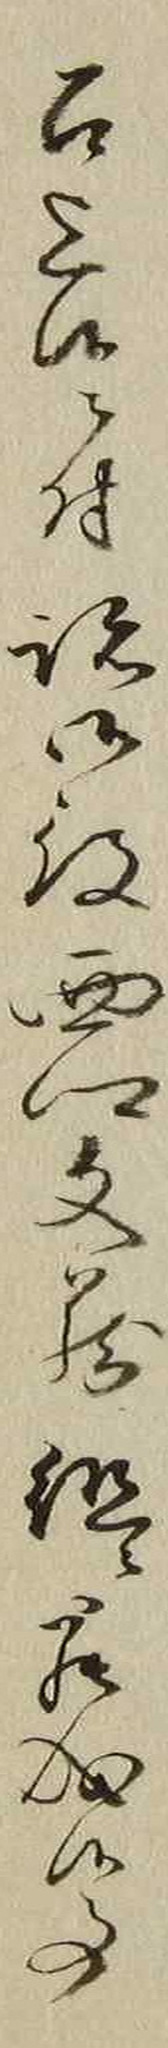召上候ニ付跡御役西郷文蔵組ニ罷成候事
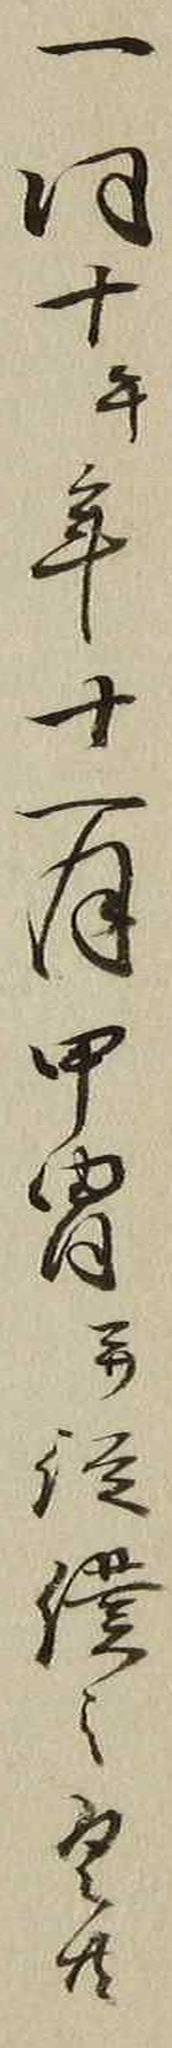一同十午年十一月甲冑并従僕之具共
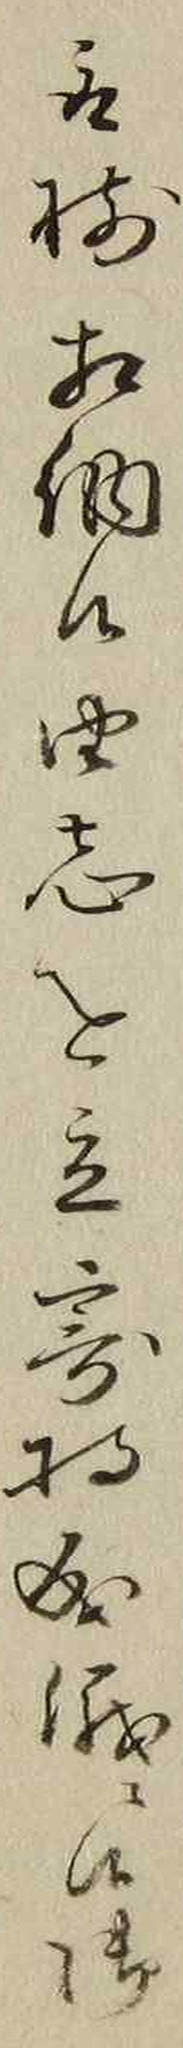取揃相納候由志を立寄持成儀ニ候御
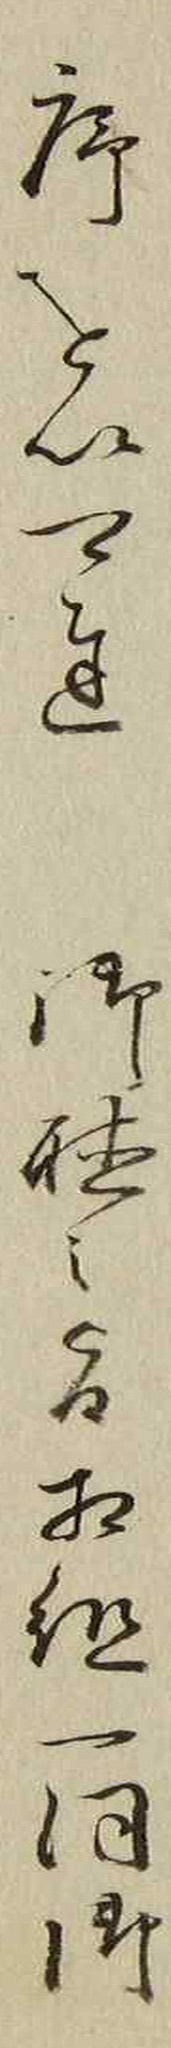序を以可達御聴之旨相組一同御
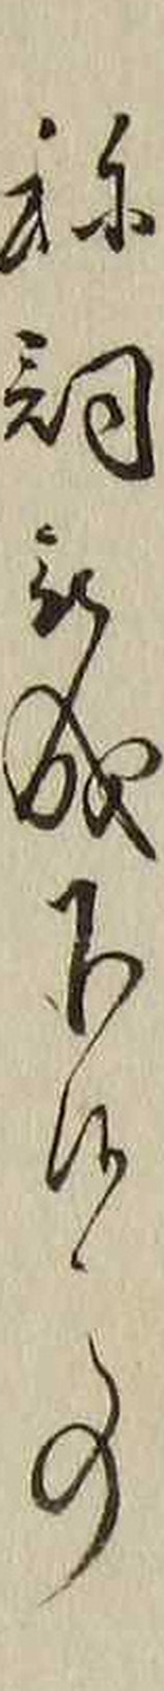称詞被成下候事
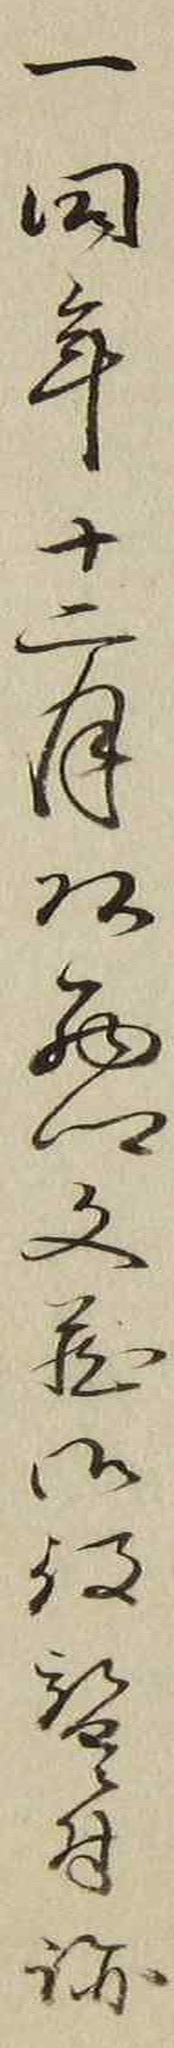一同年十二月頭西郷文蔵御役替ニ付跡
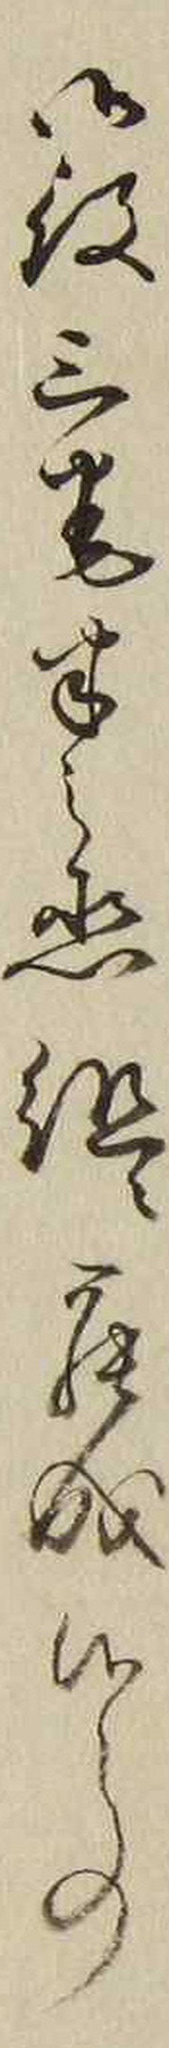御役三宅半之丞組ニ罷成候事

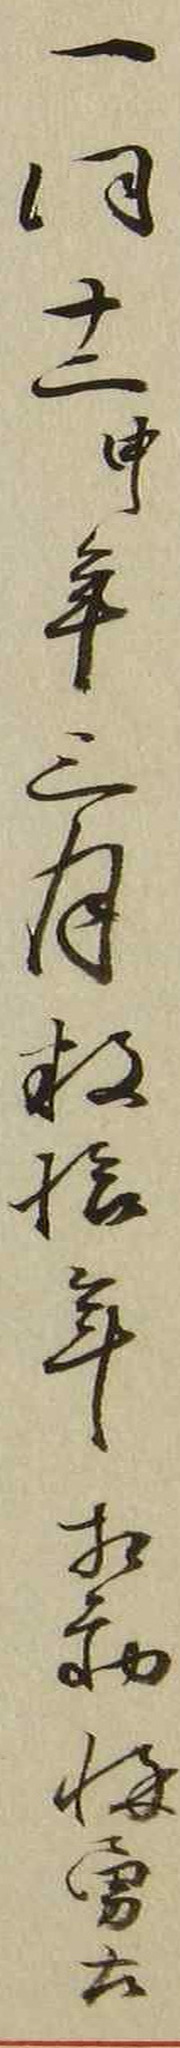一同十二申年三月数拾年相勤忰勇右
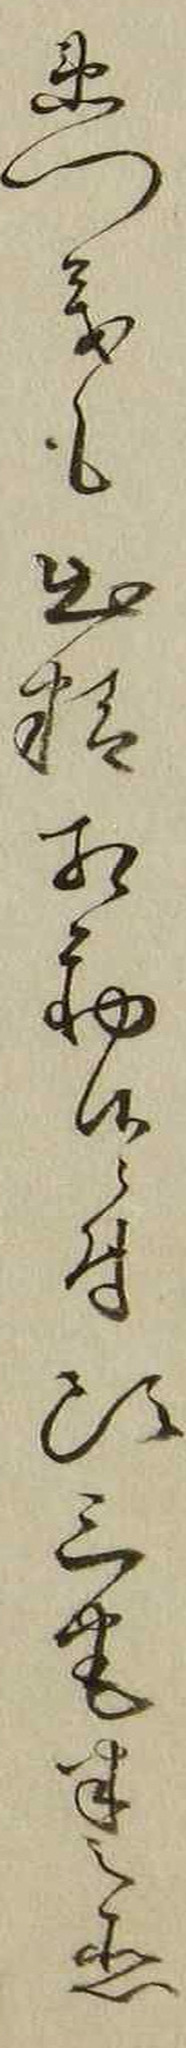衛門義も出精相勤候ニ付頭三宅半之丞
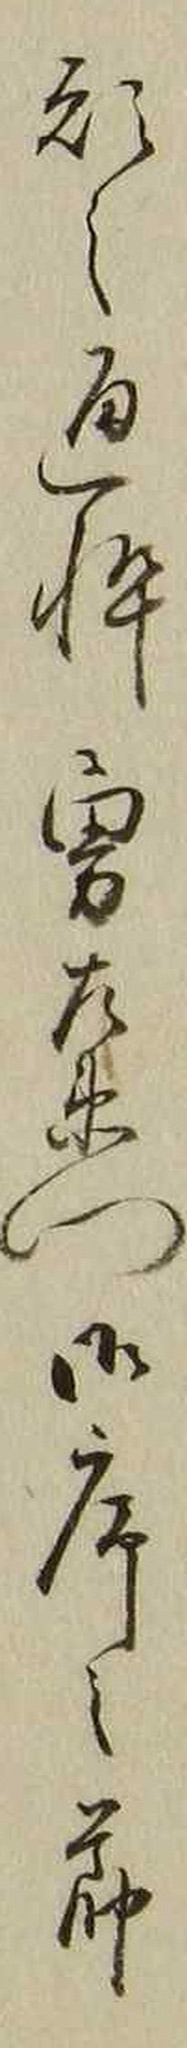願之通忰勇右衛門御序之節
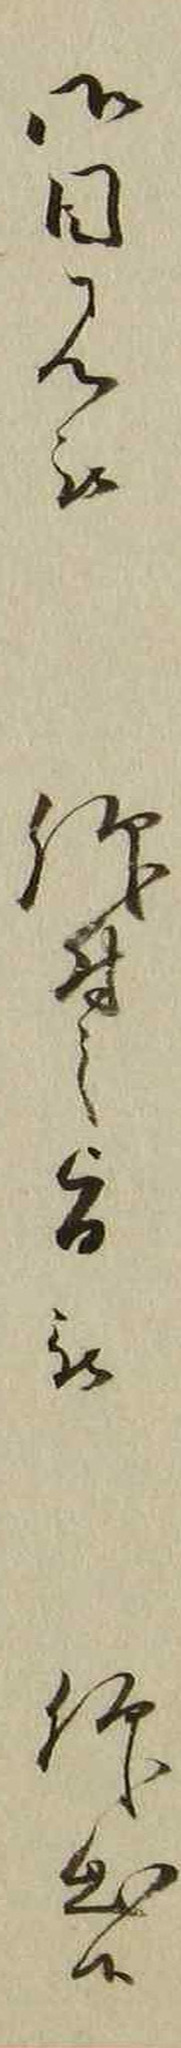御目見被仰付之旨被仰出候
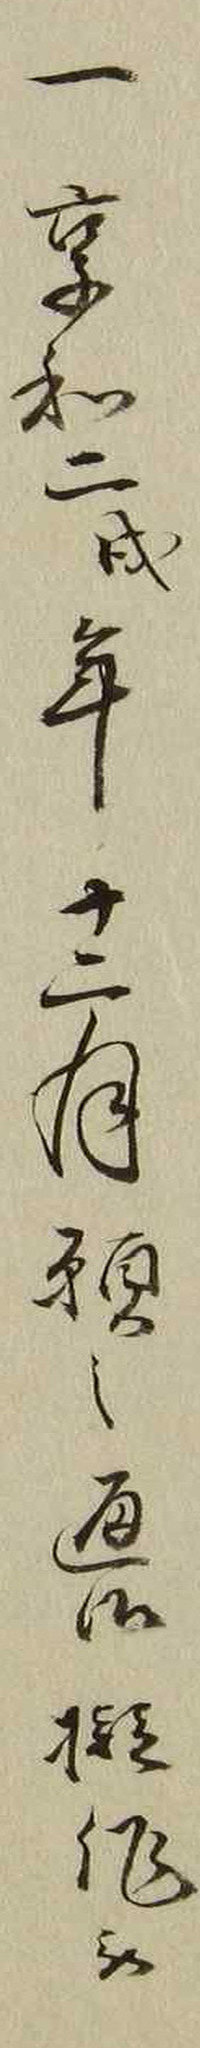一享和二戌年十二月願之通御擬作被
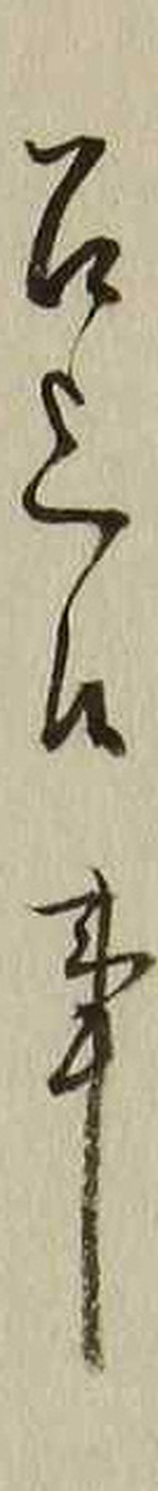召上候事
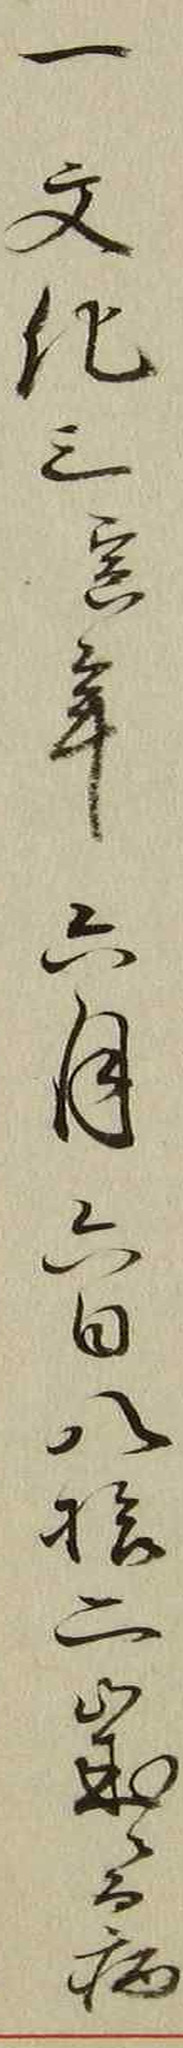一文化三寅年六月六日八拾二歳ニ而病
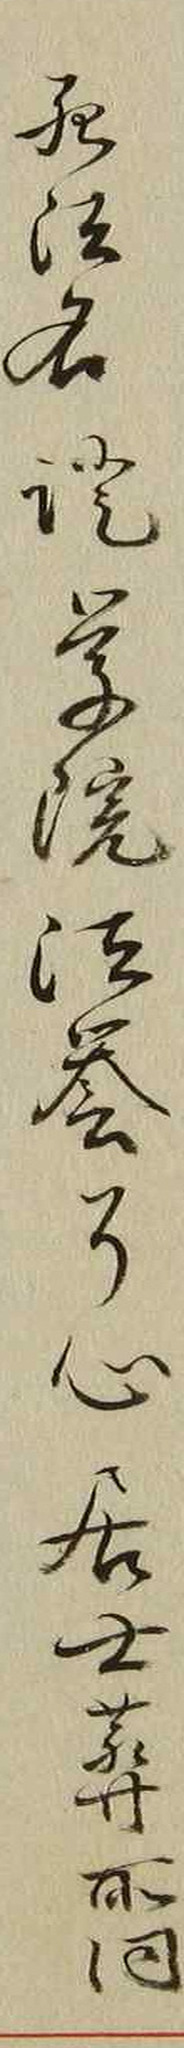死法名証学院法誉了心居士葬所同
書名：諸士系譜　巻之4　い之部4
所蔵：会津若松市立会津図書館
